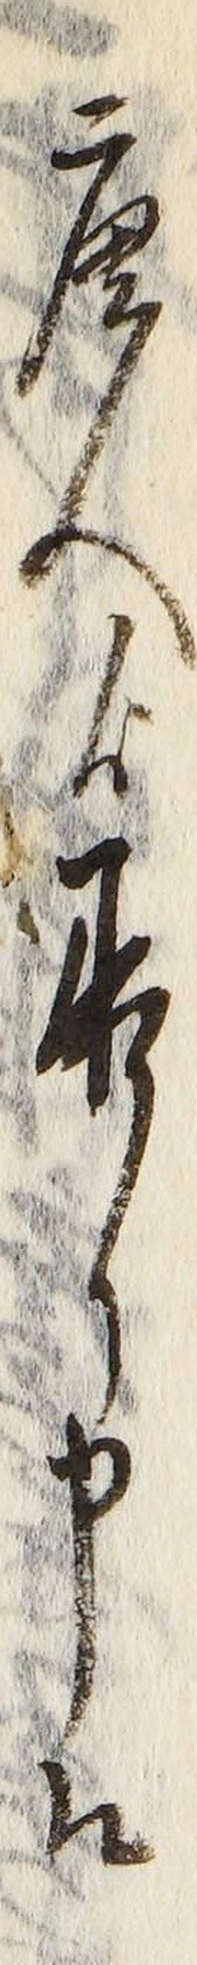唐人ゟ承り申候
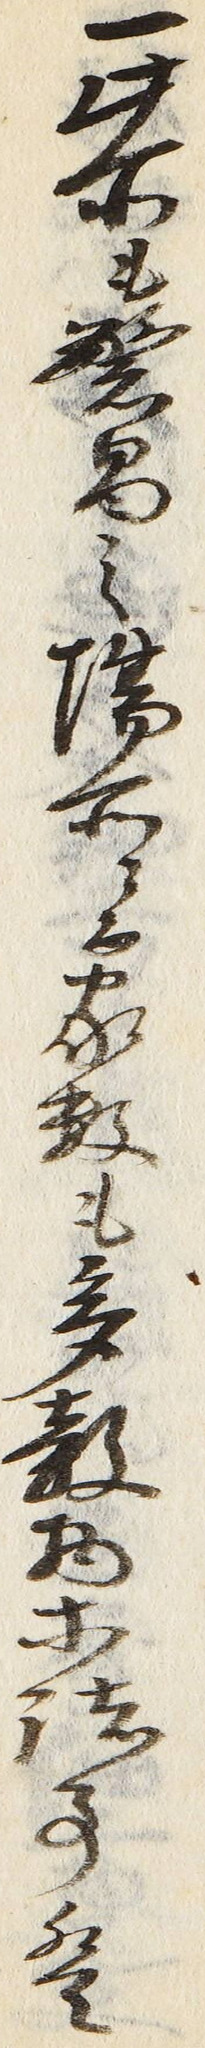一此所も繁昌之塲所ニ而家数も多穀物等諸事は
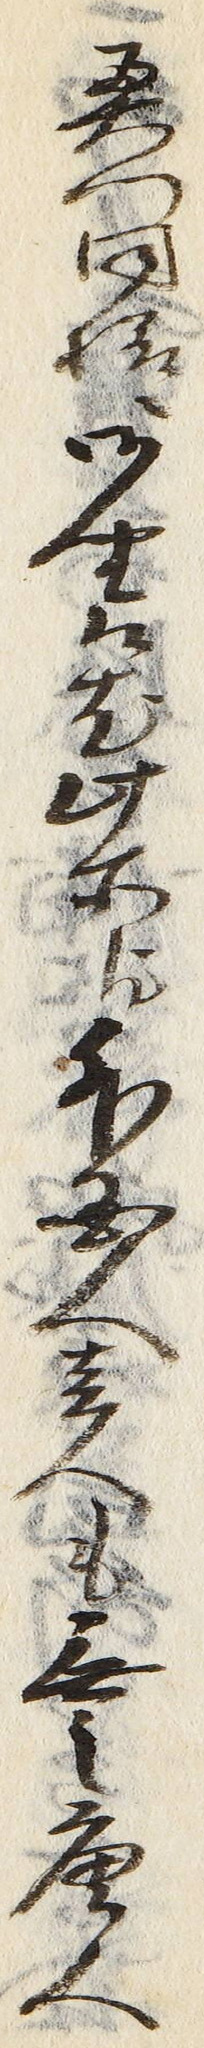奥門同様ニ御座候尤此所江外国人壱人も無之唐人
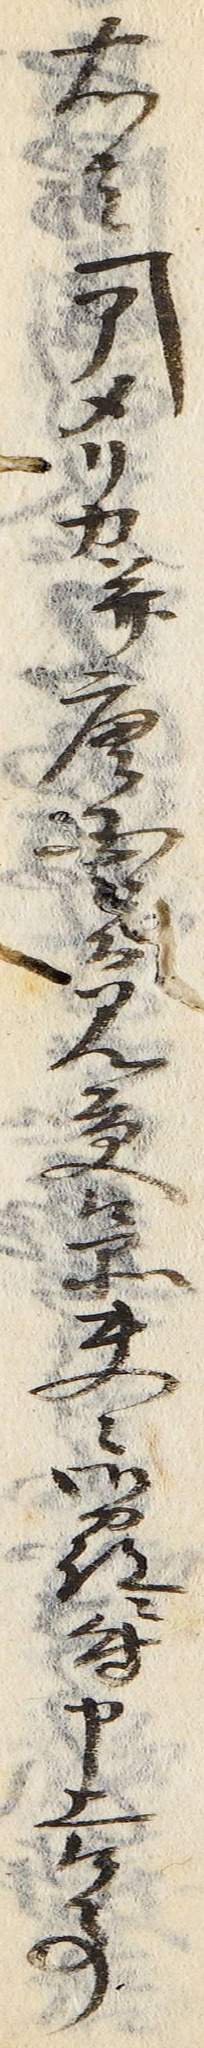右者「アメリカ幷唐国ニ而見受候品夫々御尋ニ付申上候事
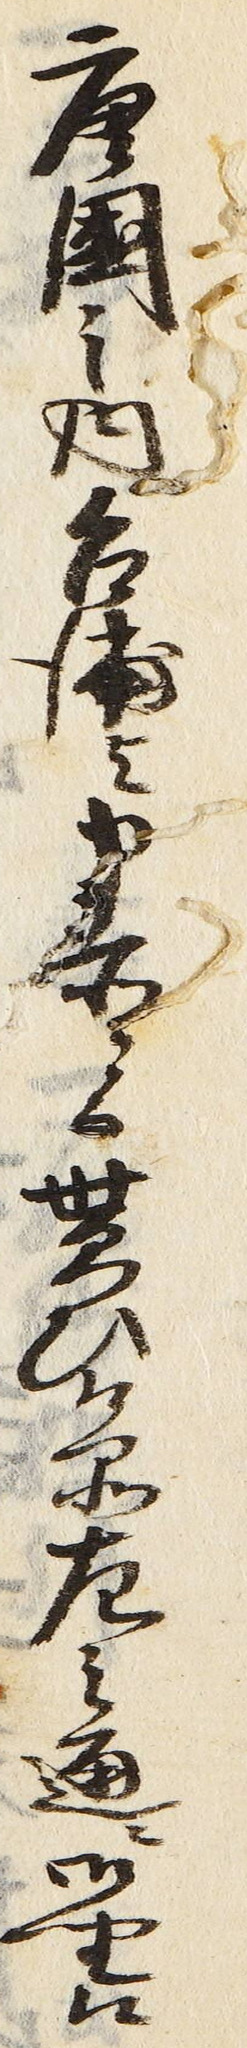唐国之内乍浦と申所ニ而貰ひ候品左之通ニ御座候
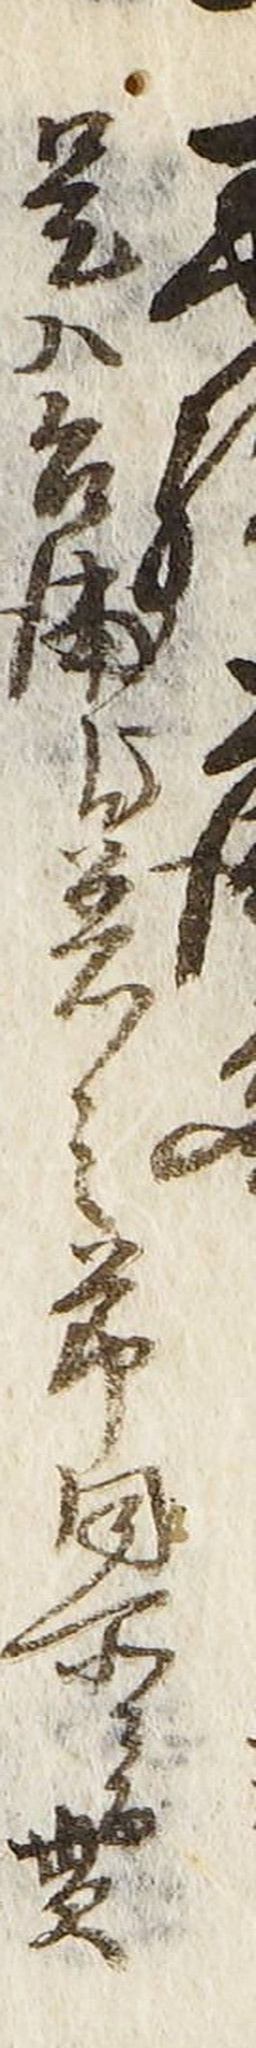是ハ乍浦江着之節同所ニ而貰
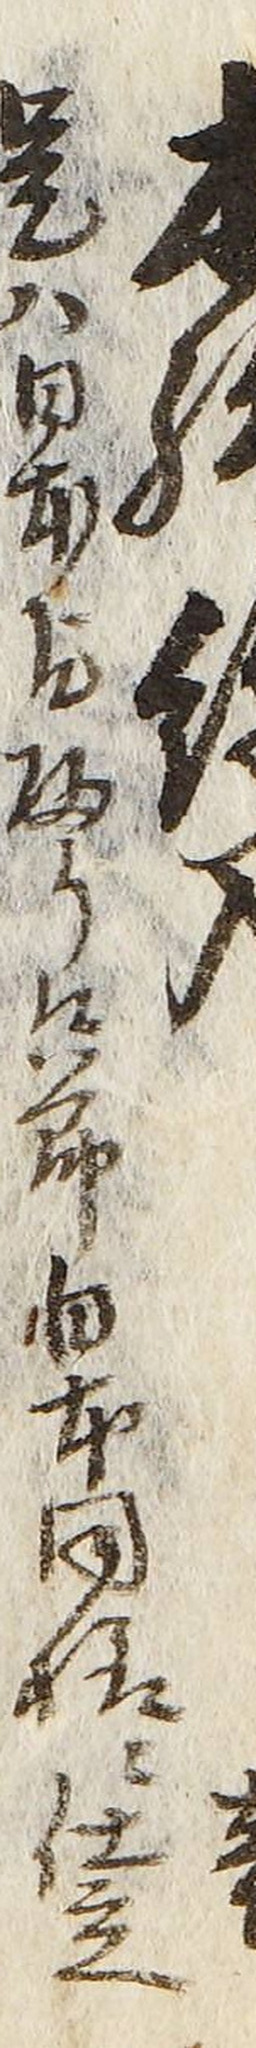是ハ日本江帰り候節日本同様ニ仕立
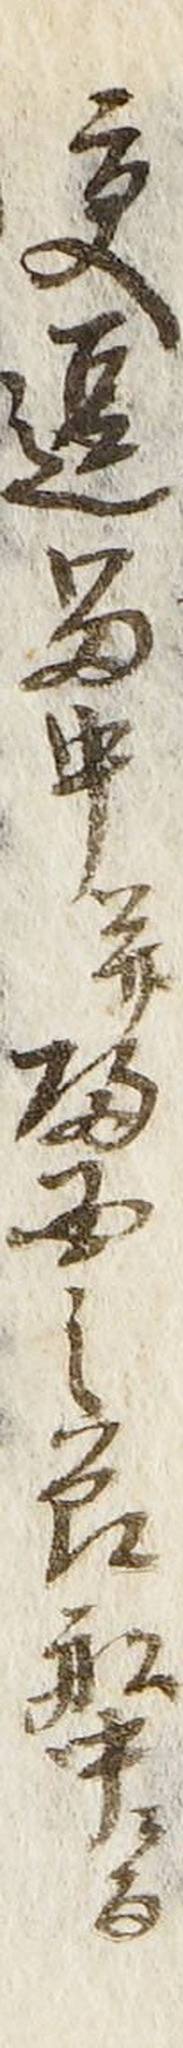受逗留中幷帰国之節舩中ニ而
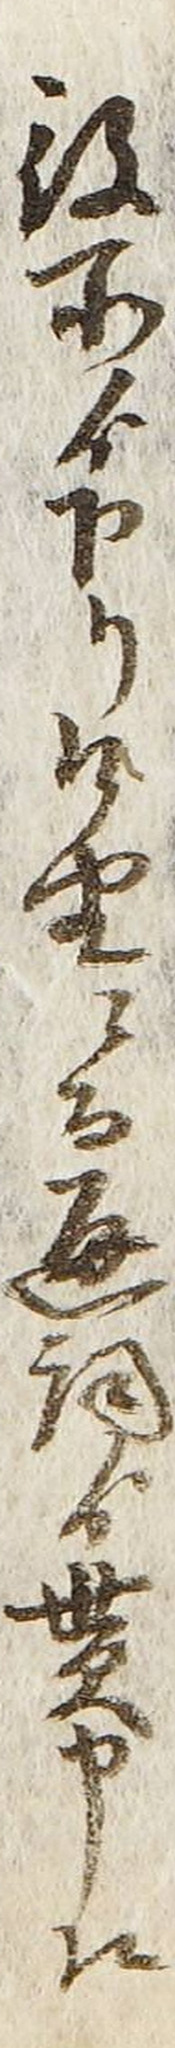役所ゟ下り候由ニ而通詞ゟ貰申候
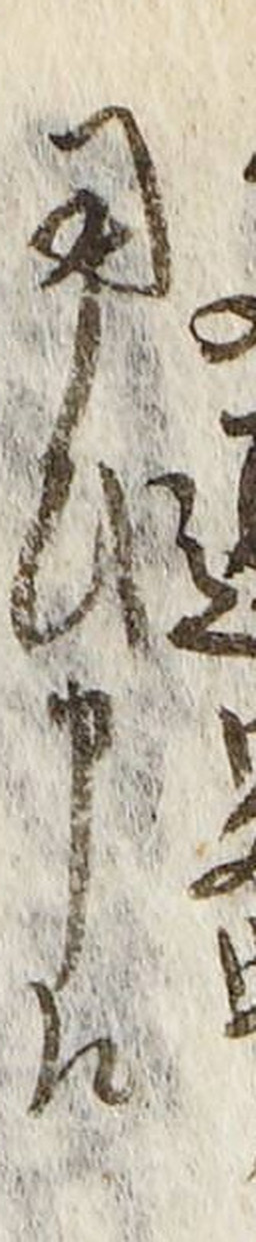用ひ申候
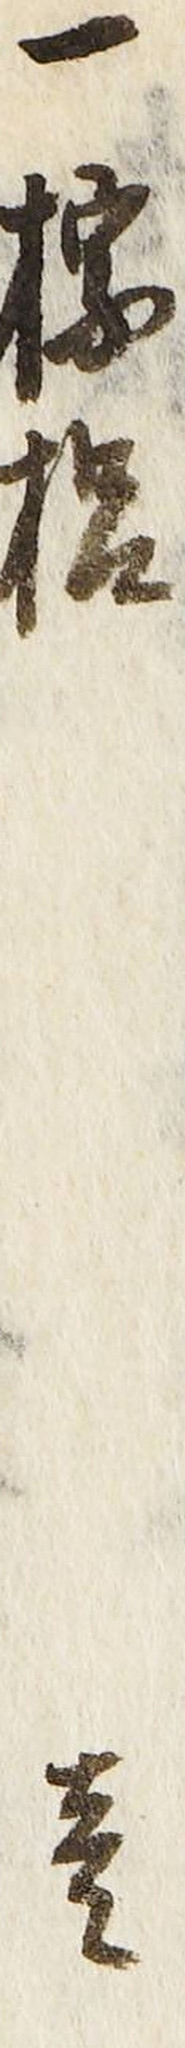一棕梠壱
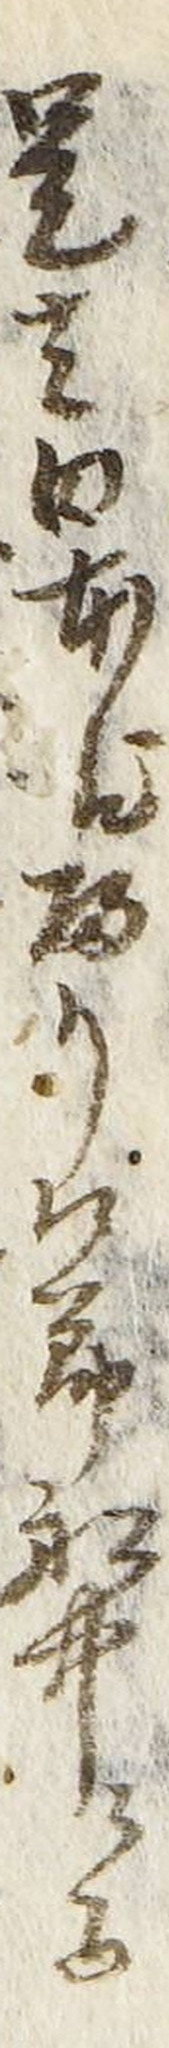是者日本江帰り候節舩中ニ而
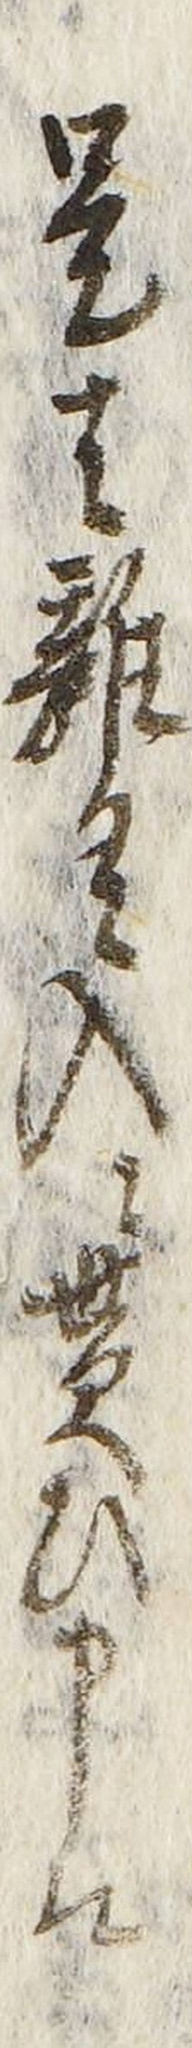是者雑具入ニ貰ひ申候
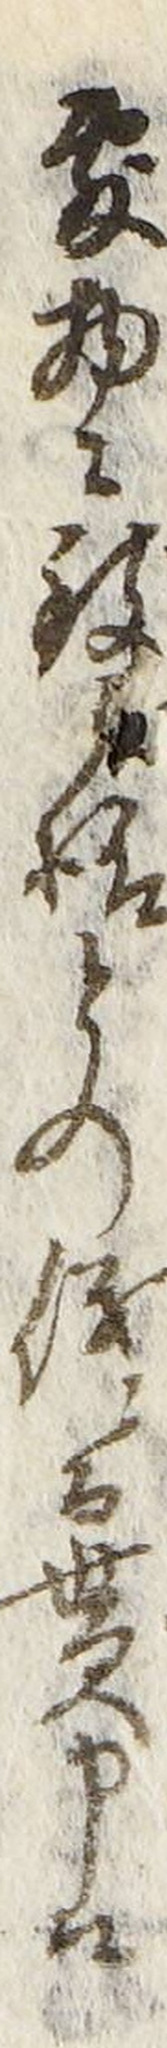敷物ニ致候様との儀ニ而貰申候
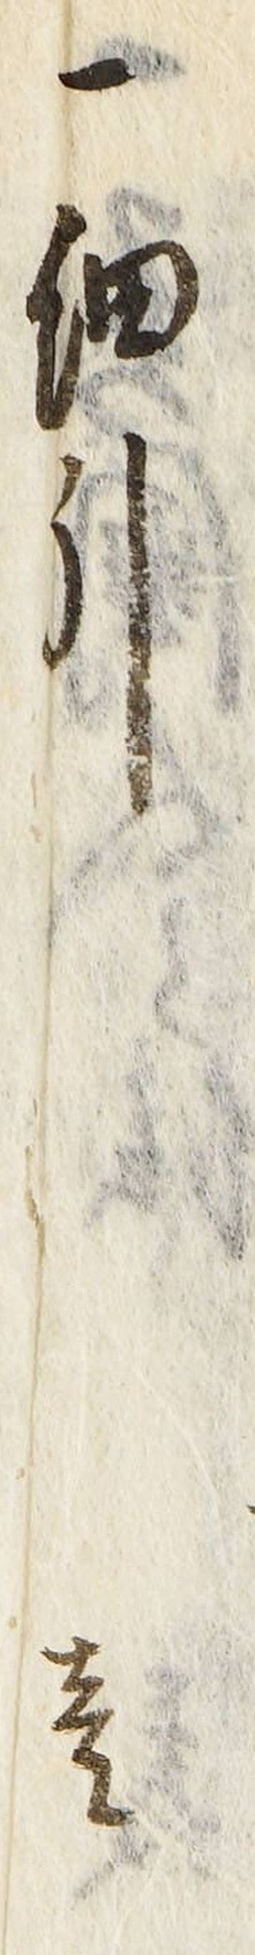一細引壱
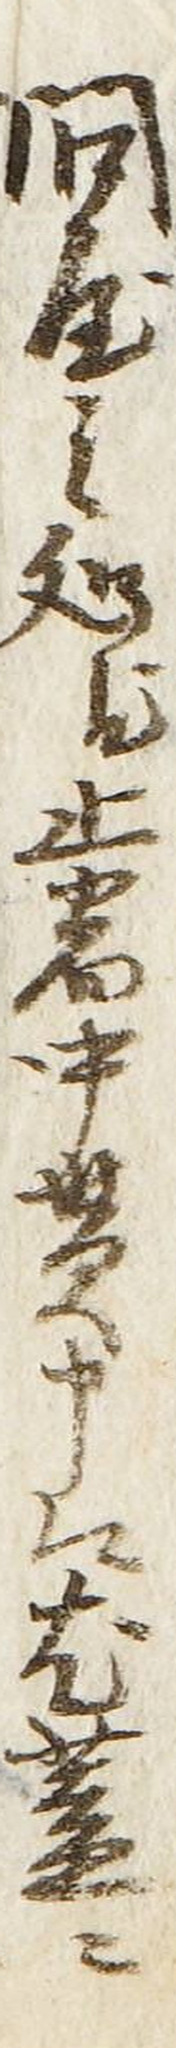問屋之処江止宿中貰申候尤蓋ニ
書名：漂流人善助聞書
